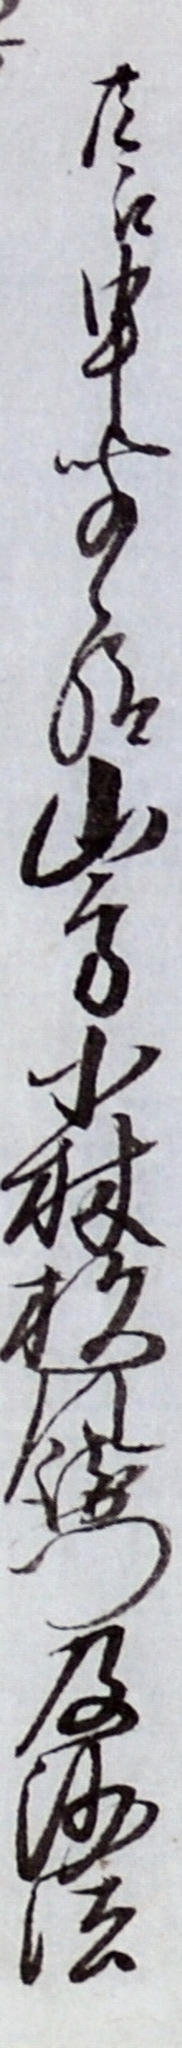共江申聞候様山方小林杉左衛門及沙汰
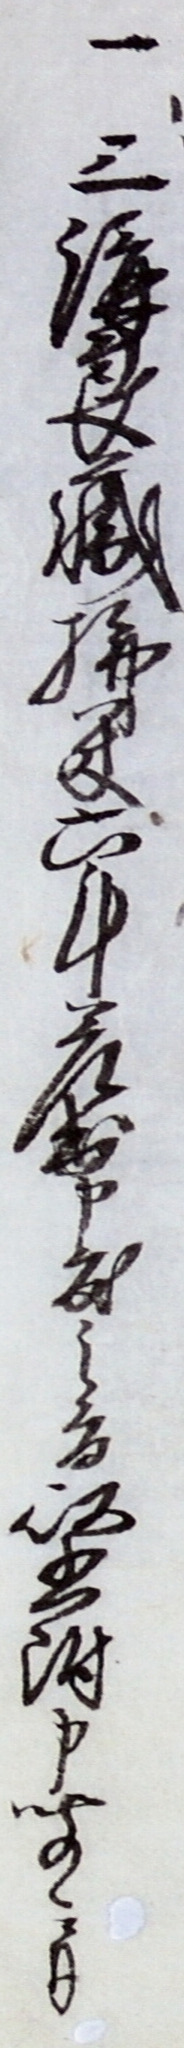一三講良蔵払米六斗差出申度之旨以書附申聞候ニ付

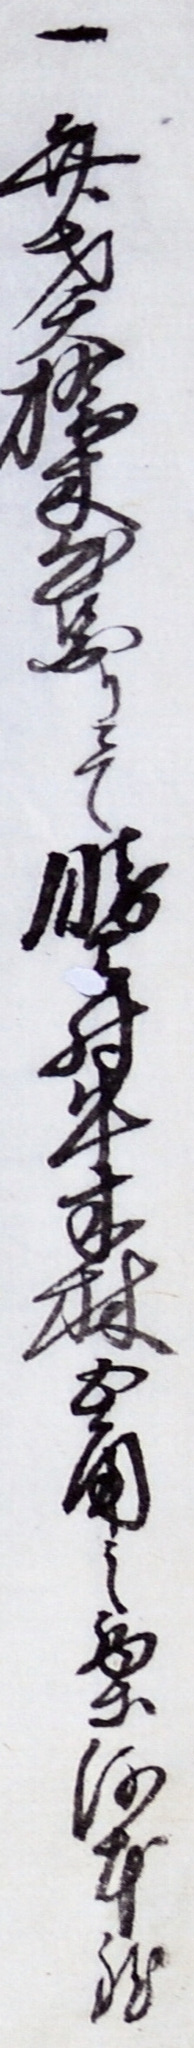一弁才天橋木心図りニて勝間村牛木林五角之栗何本程
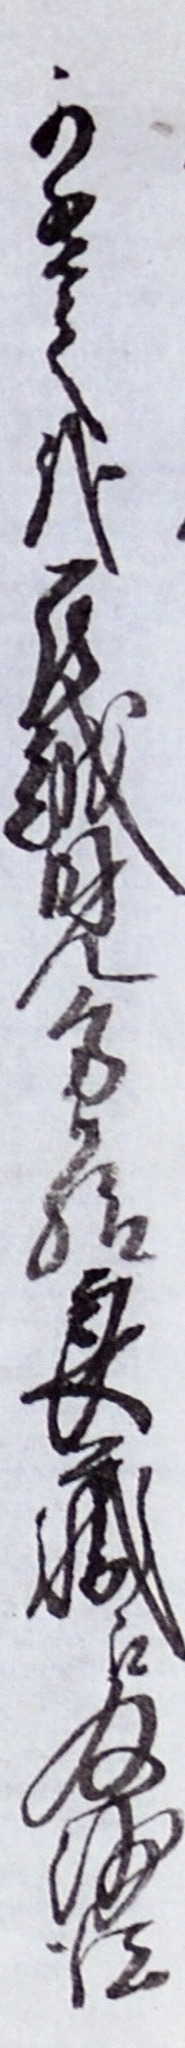可有之哉罷越見分候様良蔵え為沙汰
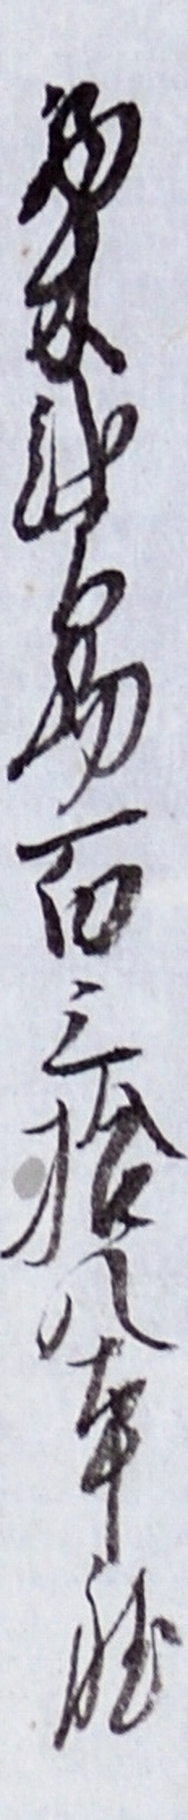栗弐間物百三拾八本程
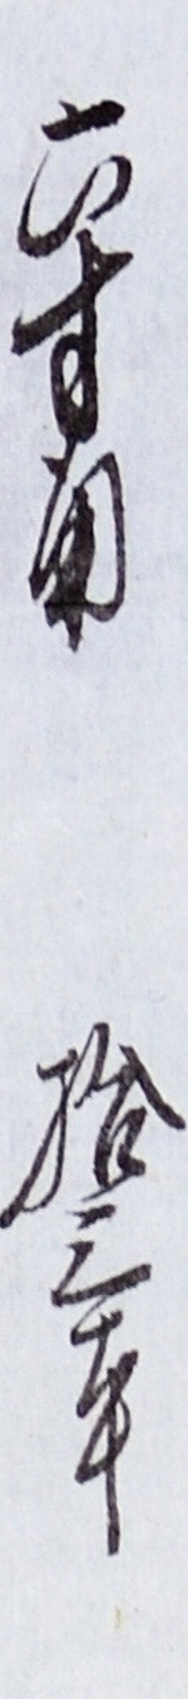六寸角拾三本
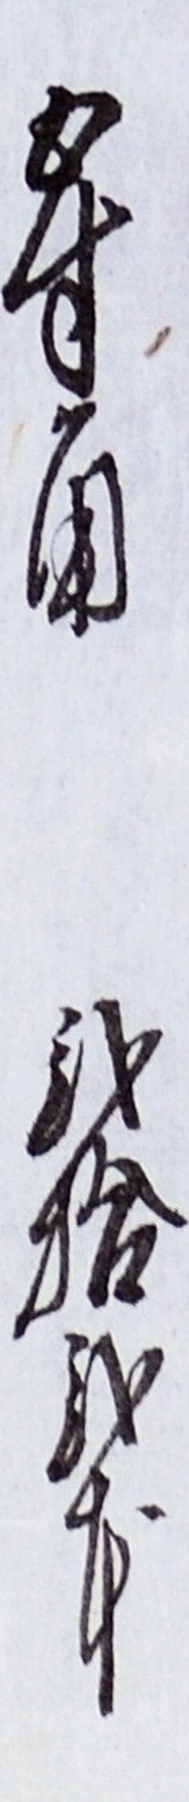五寸角弐拾弐本
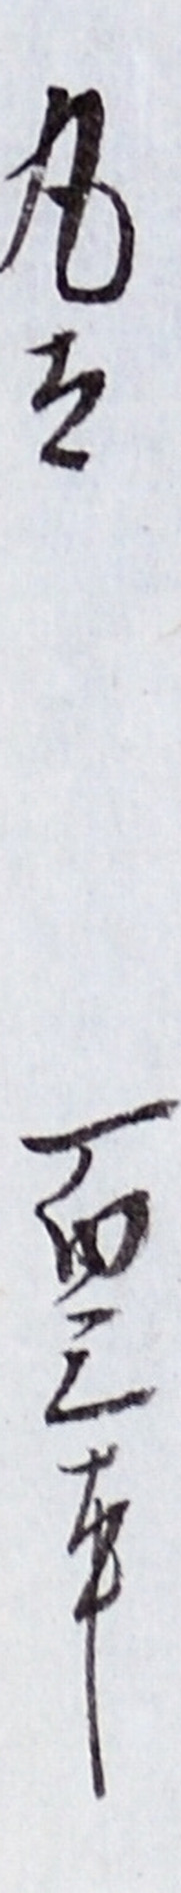丸太百三本
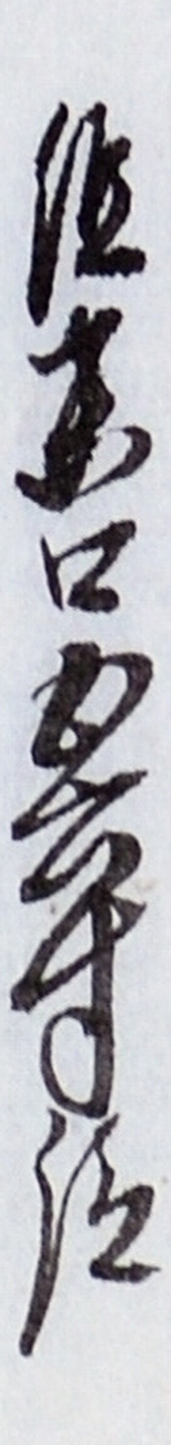但末口五六寸位
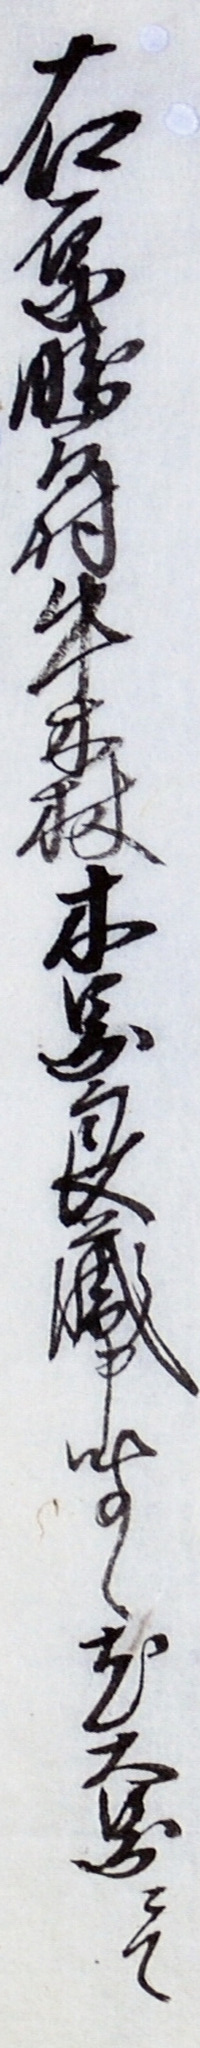右原勝間村牛木林木図良蔵申聞候尤大図ニて
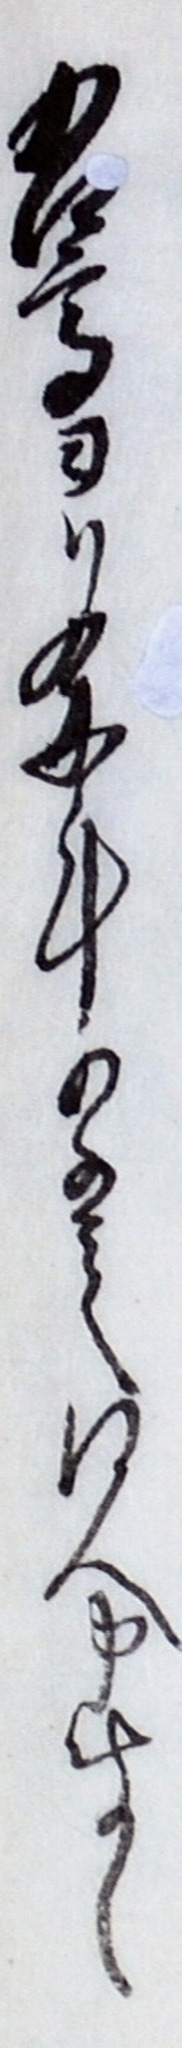右高ヨリ幾斗可有之同人申聞候
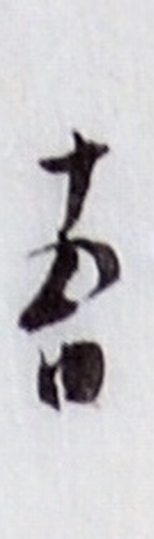十五日
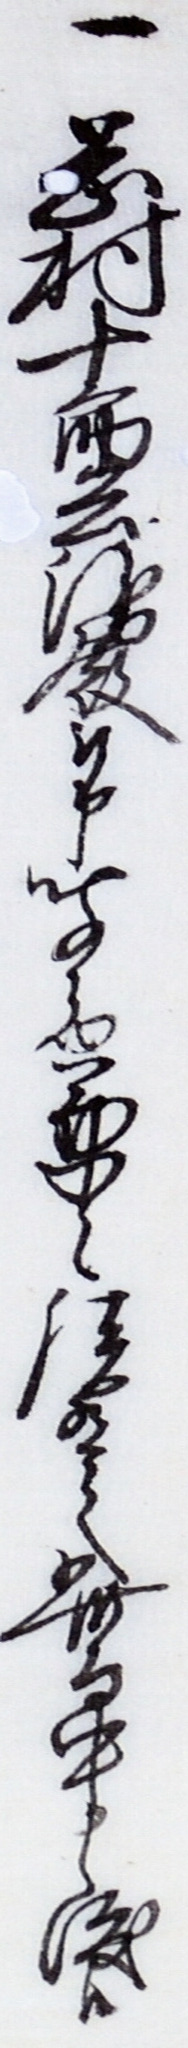一岡村十郎兵衛殿被申聞付兼々談有之此間中申渡候
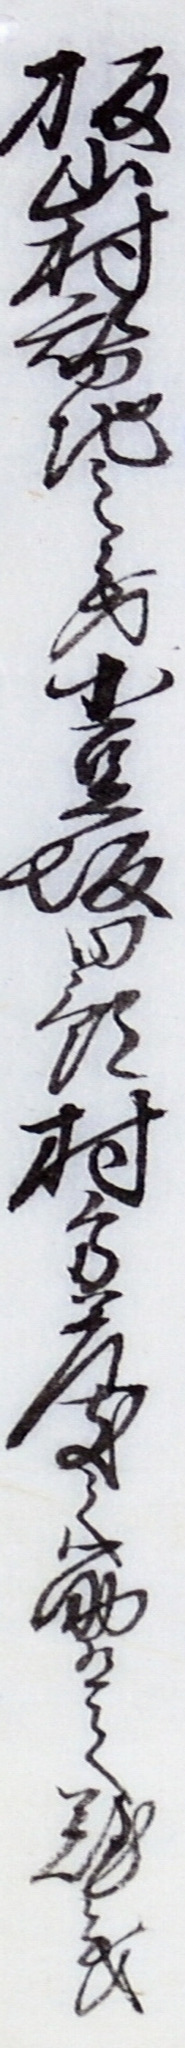板山村替地之義尾小豆坂田領村方差支之筋有之難義
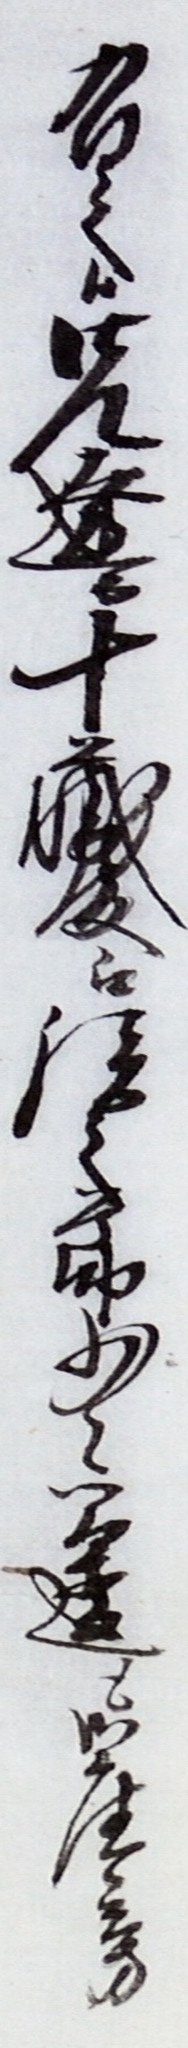有之候先達而十蔵殿談之節少は間違も御座候旁
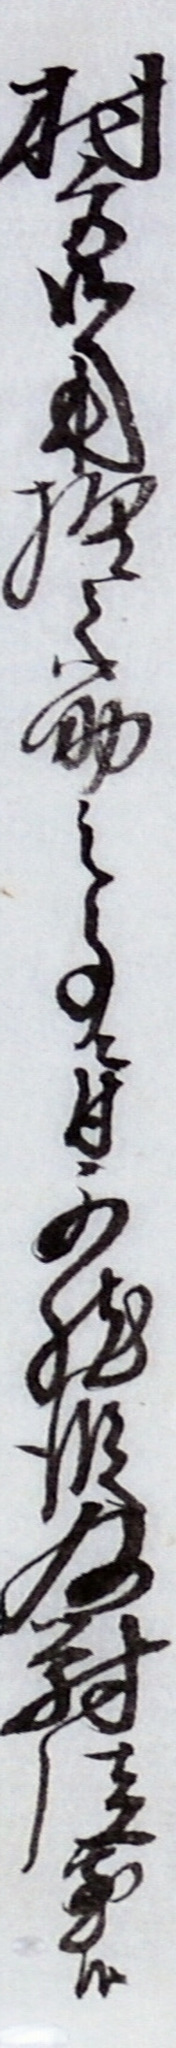村方御用捨之筋之事ニ付可然段為対談置候
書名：御山奉行御用控
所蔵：伊那市立高遠町図書館・合同会社AMANE
